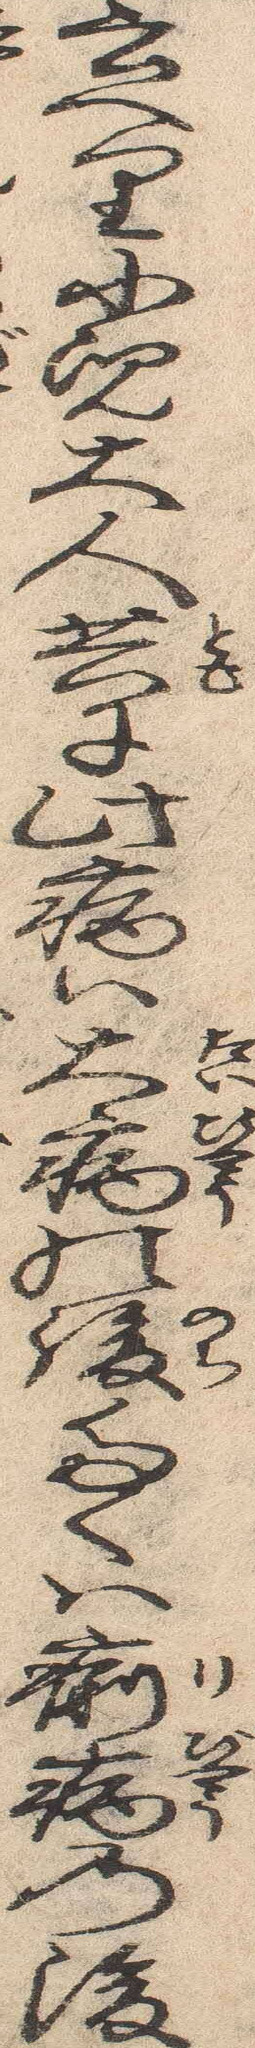云へり小児大人共に此病は大病の後多くは痢病の後
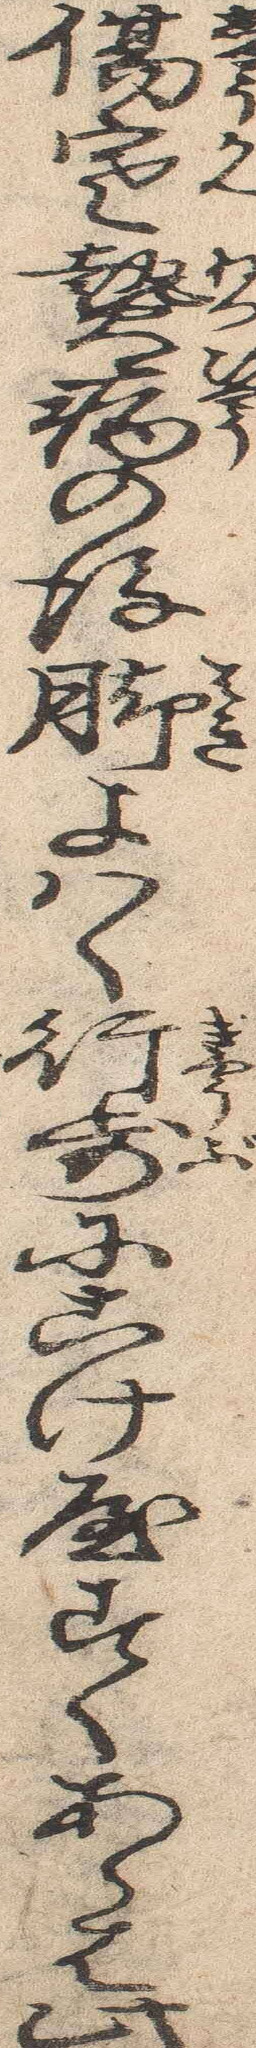傷寒熱病の後脚よはく行歩にこけやすくあらは此
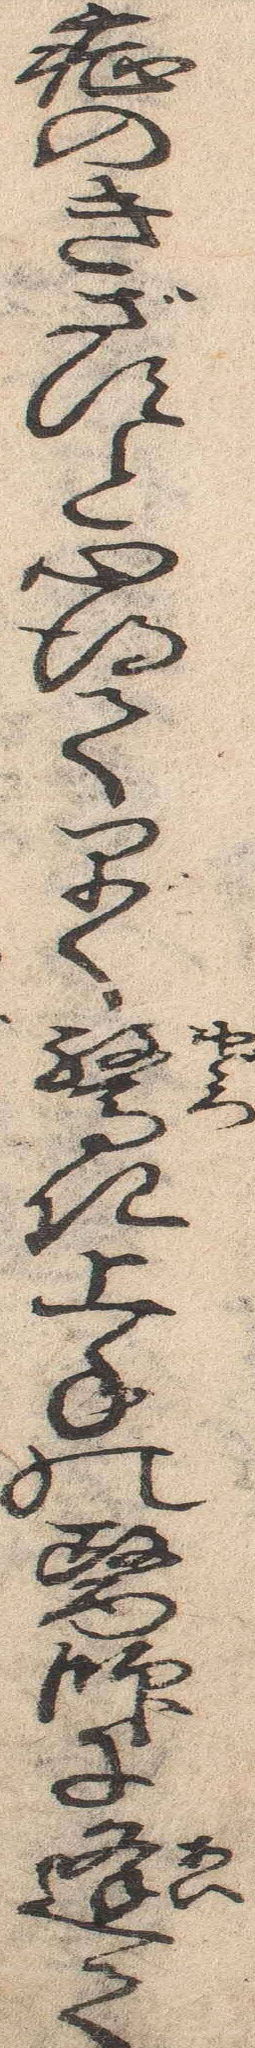症のきざすと心得て早く驚き上手の医師に逢て
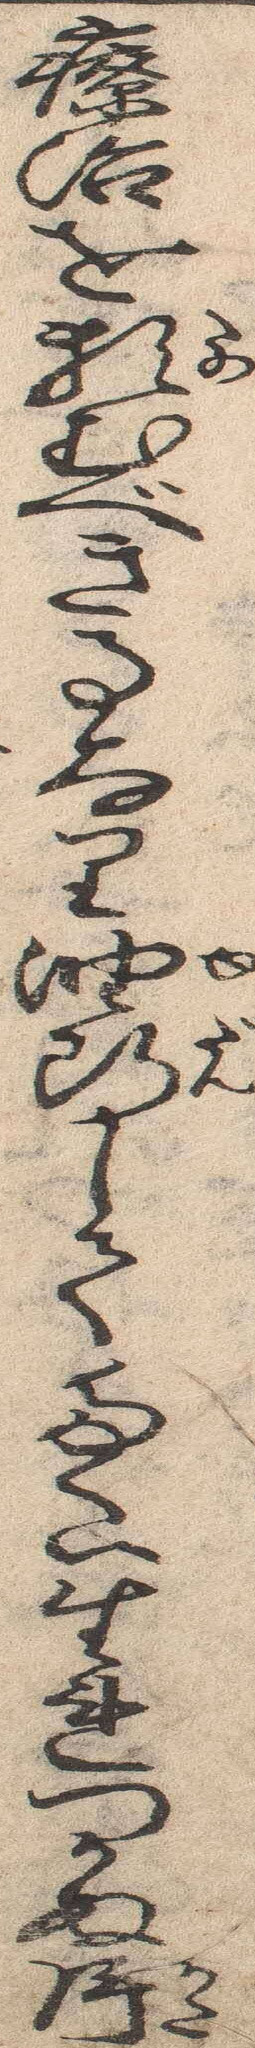療治を頼むべき事なり油断して多くは生れつかぬ片
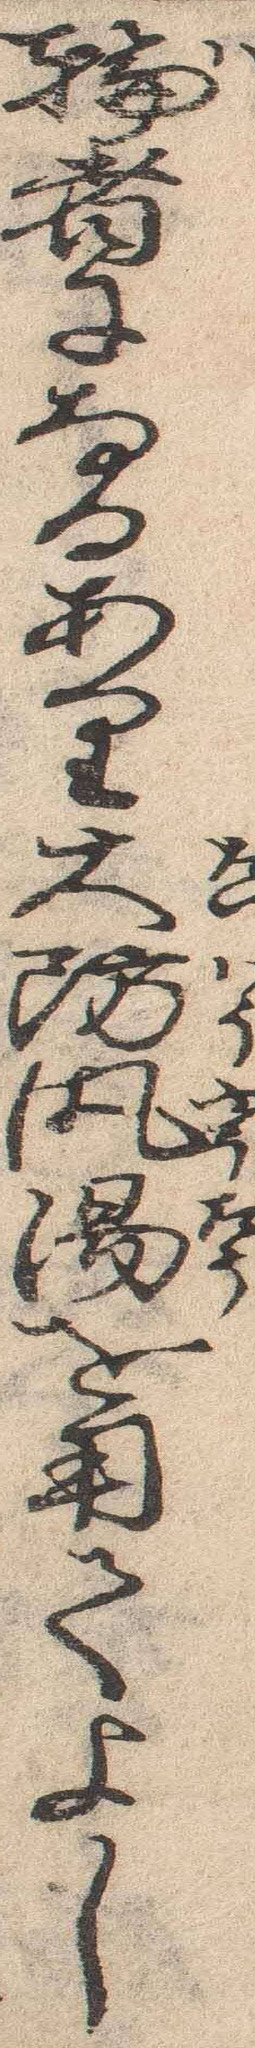輪者になるあり大防風湯を用てよし

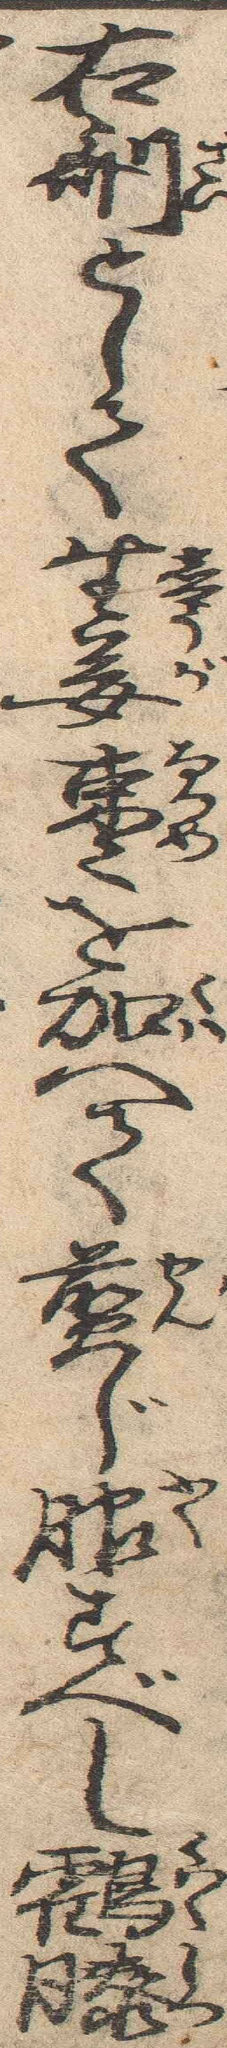右剤として生姜棗を加へて煎じ服すべし鶴膝
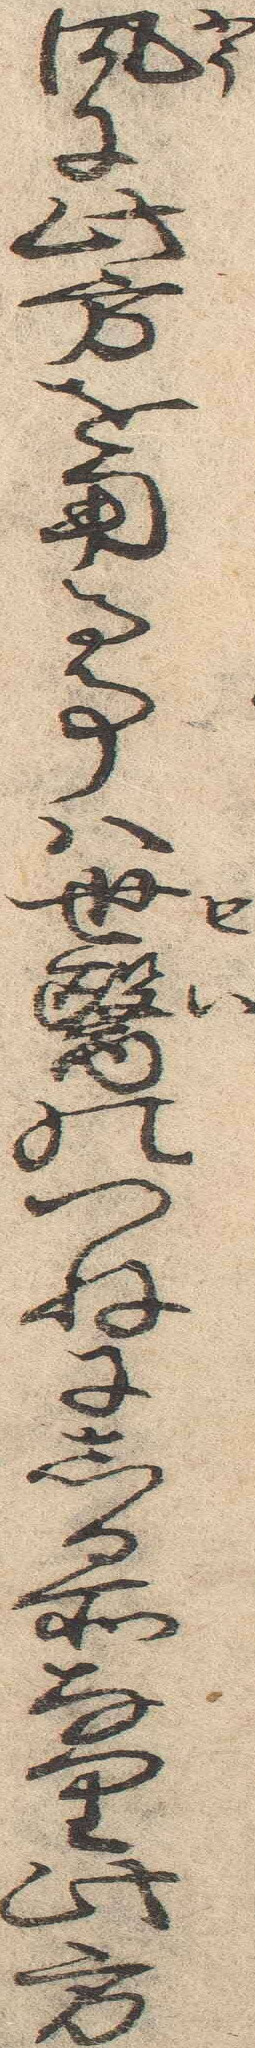風に此方を用る事は世医のつねにしる所なり此方
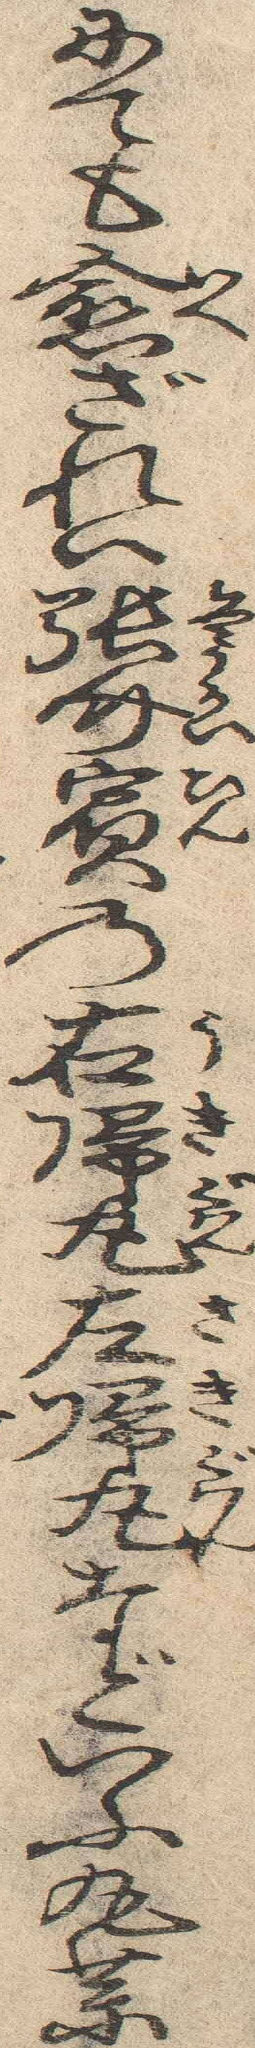にても愈ざれは脹介賓の右帰丸左帰丸などいふ丸薬
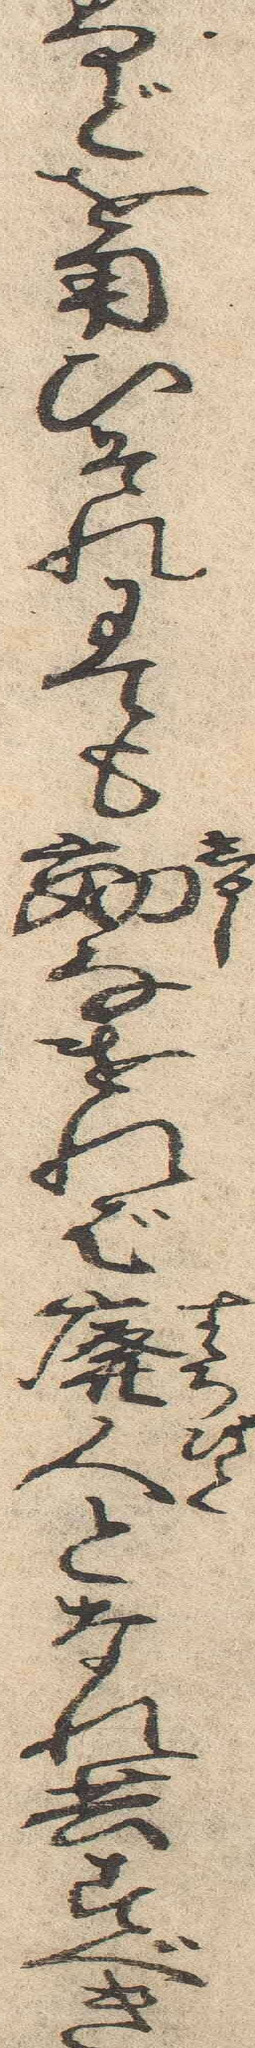などを用ひそれにても効なければ廃人となれ共すべき
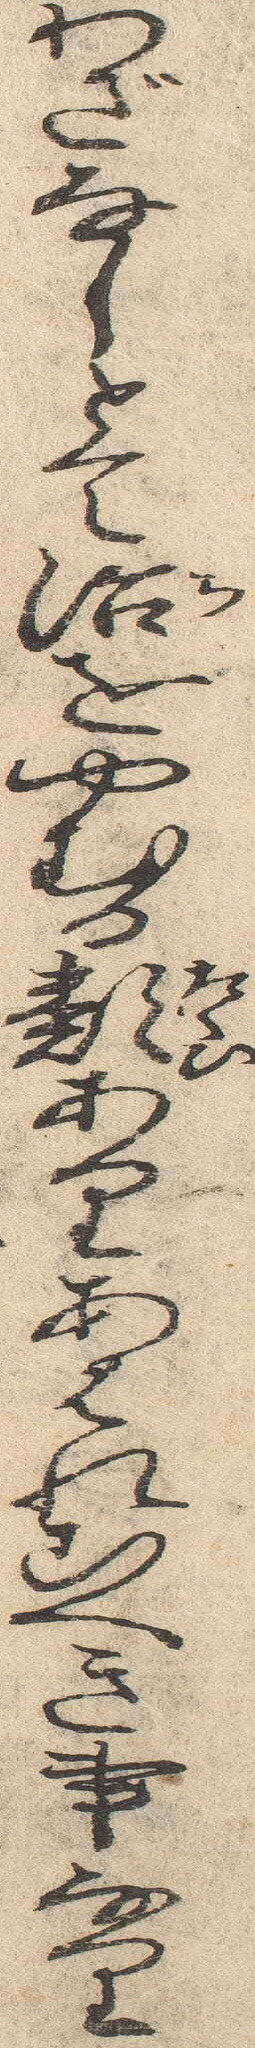わざなしとて治をやむる類ありあはれむへき事なり
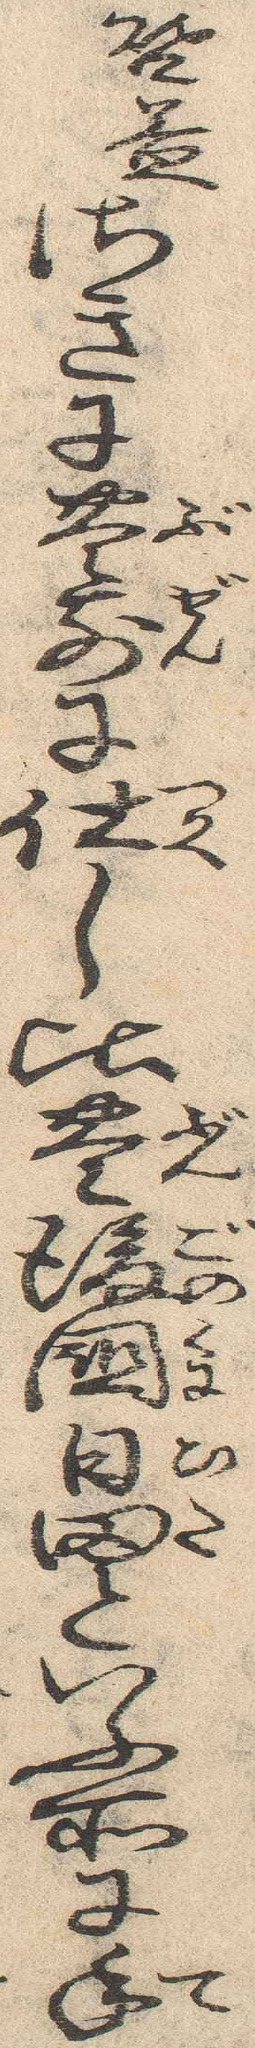啓益さきに豊前に仕し比豊後国日田といふ所に手
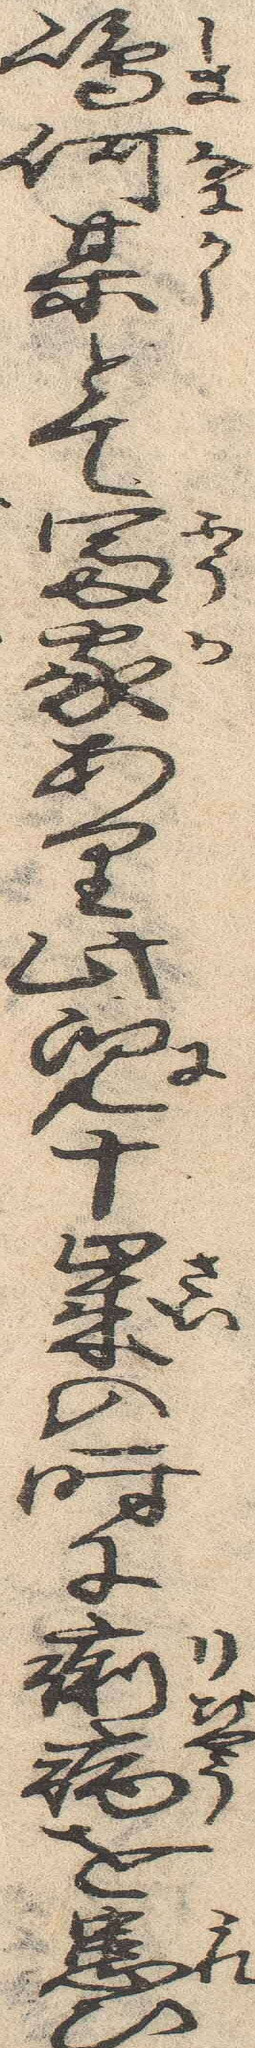嶋何某とて富家あり此児十歳の時に痢病を患ひ
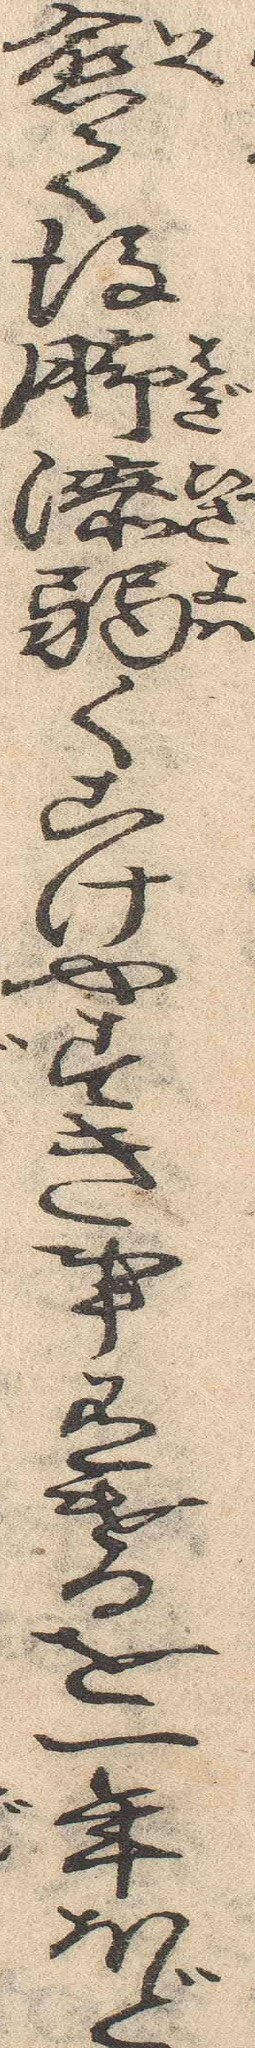愈て後脚膝弱くこけやすき事有けるを一年ほど
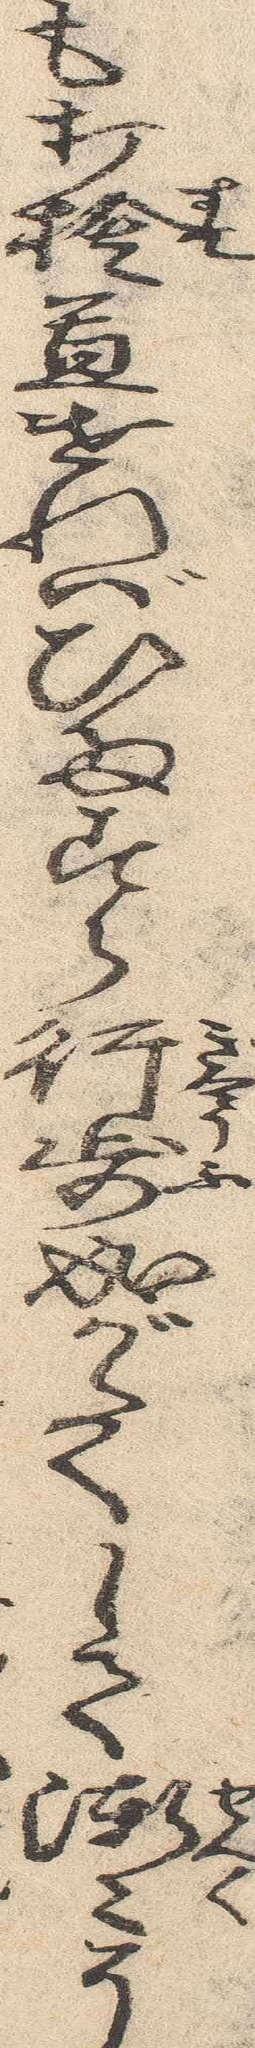も打捨置ければひたすら行歩成がたくして漸々に
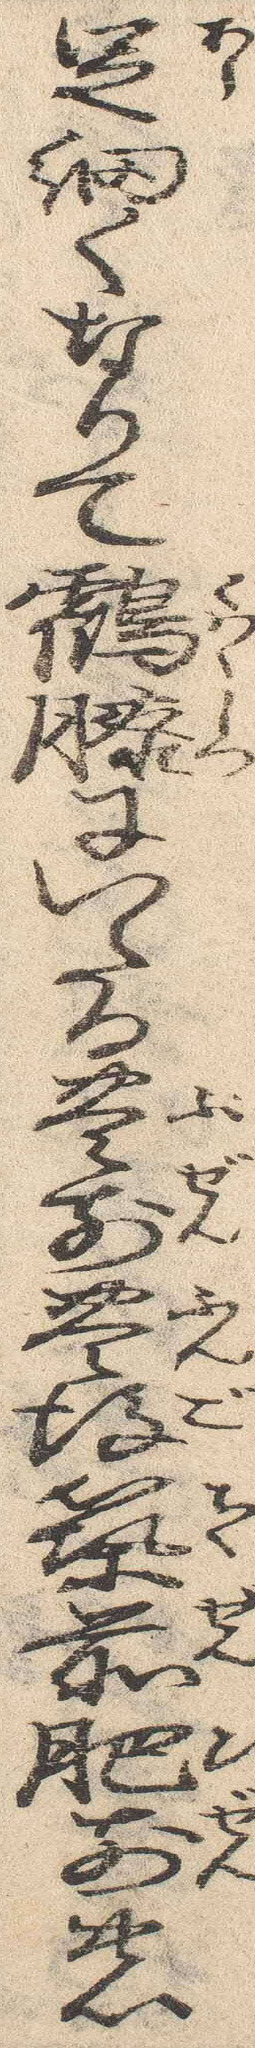足細くなりて鶴膝にいたる豊前豊後筑前肥前の
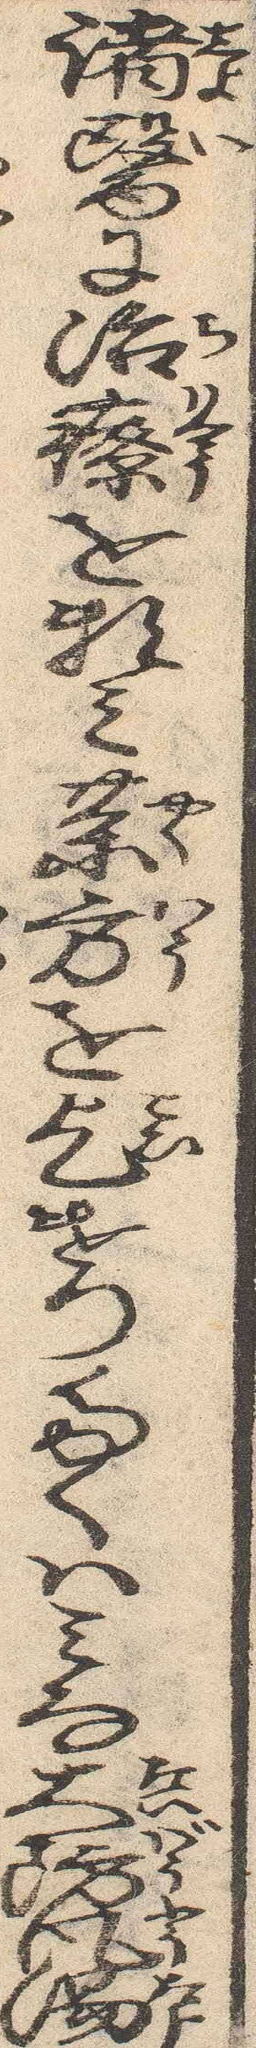諸医に治療を頼み薬方を乞けり多くはみな大防風湯
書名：小児必用養育草
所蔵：東京学芸大学附属図書館 国文学研究資料館
